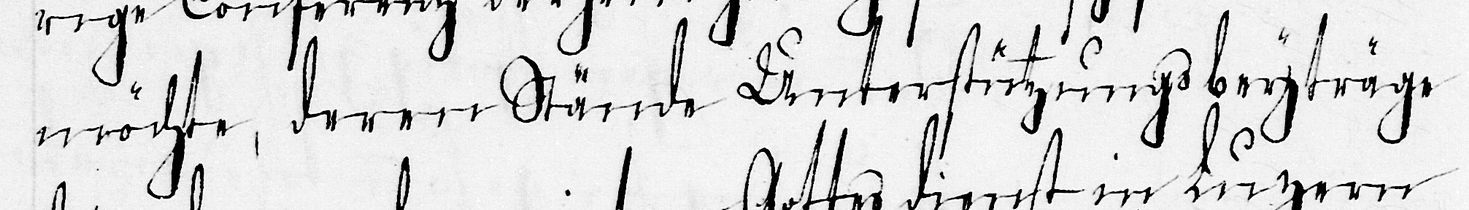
möchte, deren Stände Unterstützungsbeyträge
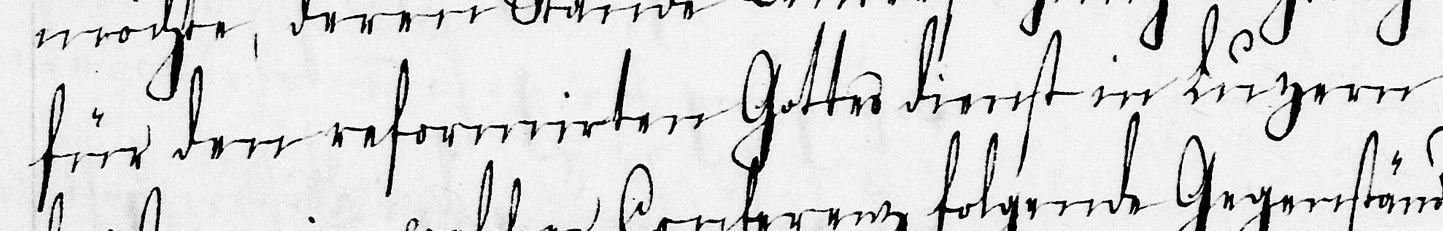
für den reformirten Gottesdienst in Luzern
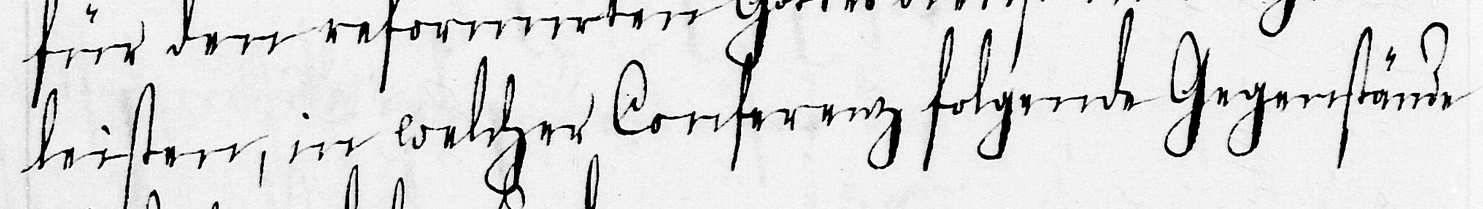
leisten, in welcher Conferenz folgende Gegenstände
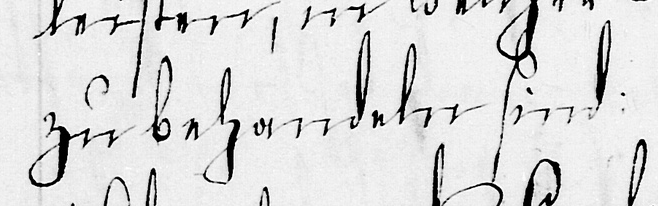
zu behandeln sind:
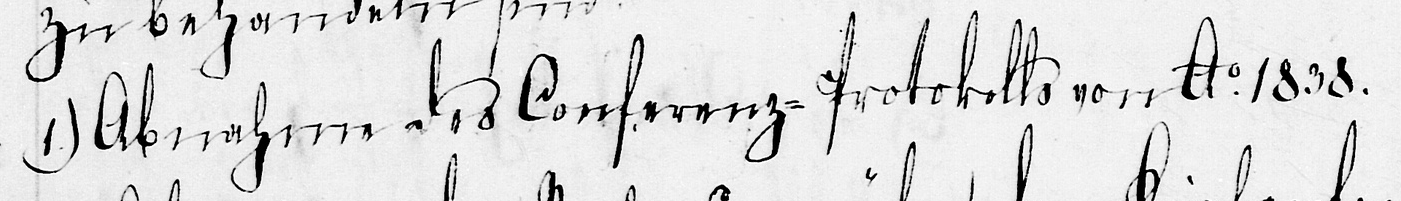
1.) Abnahme des Conferenz-Protokolls von Ao. 1838.
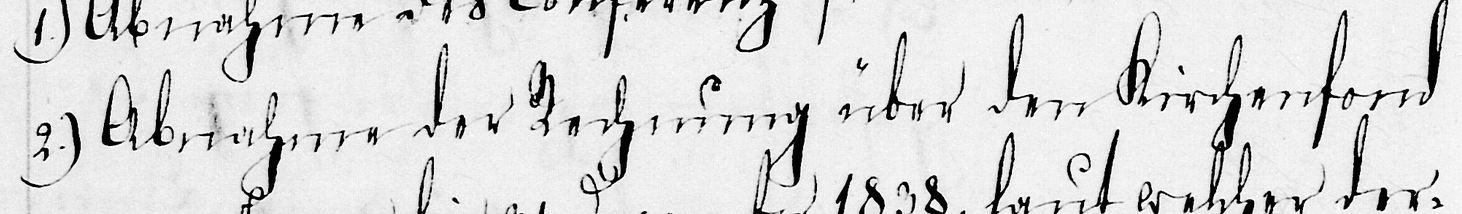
2.) Abnahme der Rechnung über den Kirchenfond
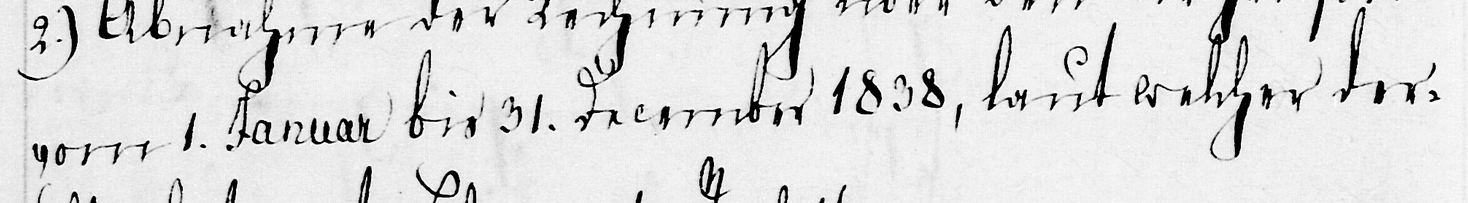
vom 1. Januar bis 31. December 1838, laut welcher der¬
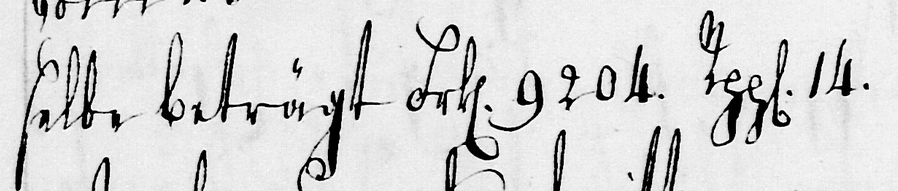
selbe beträgt Frk[en]. 9204. Rpp[en].
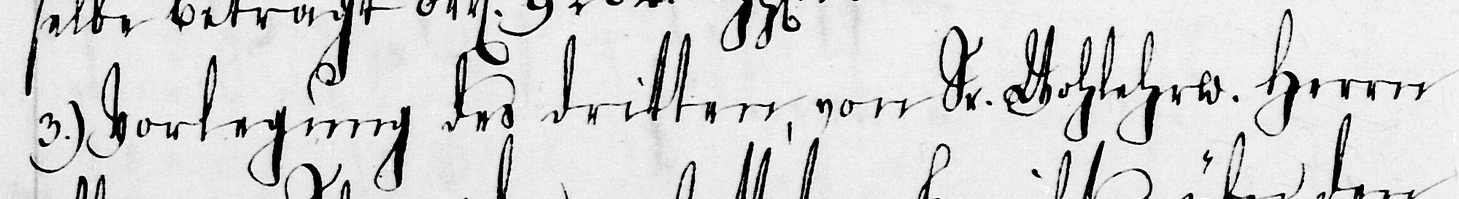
3.) Vorlegung des dritten, von Sr. Wohlehrw. Herrn
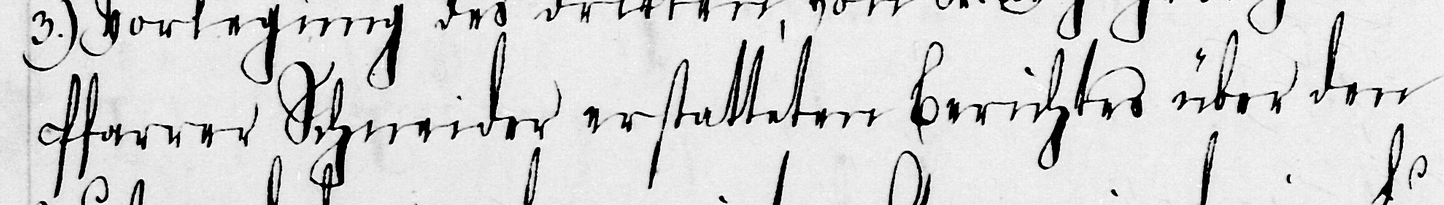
Pfarrer Schneider erstatteten Berichtes über den
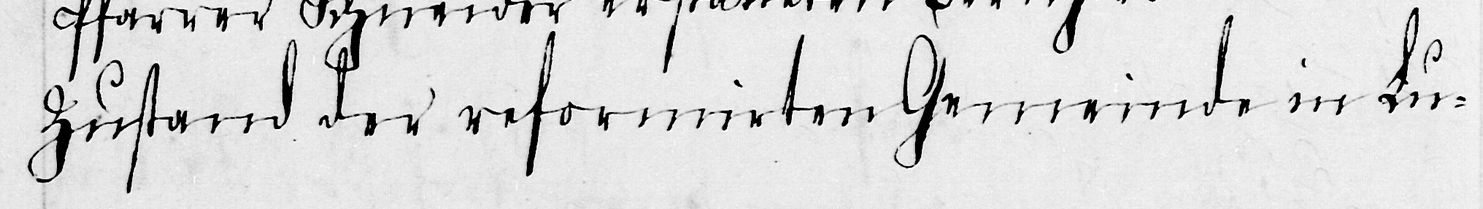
Zustand der reformirten Gemeinde in Lu¬
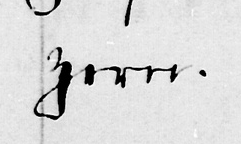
zern.
